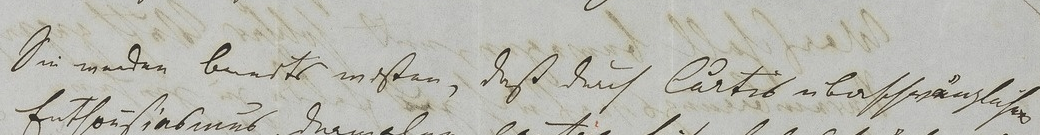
Sie werden bereits wißen, daß durch Curtis überschwänglichen
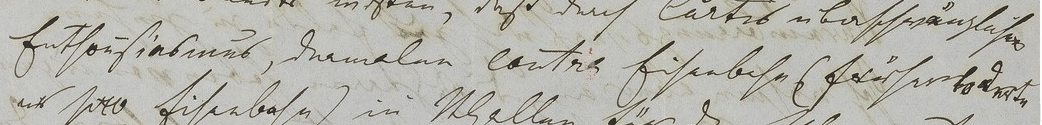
Enthousiasmus, dermalen contra Eisenbahn (früher loderte
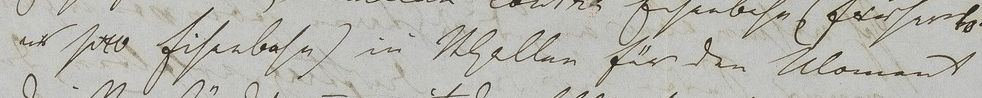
er pro Eisenbahn) in StGallen für den Moment
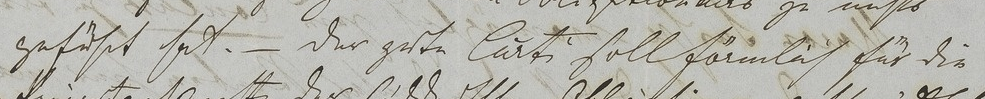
geführt hat. – Der gute Curti soll förmlich für die
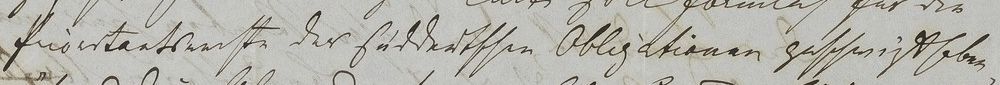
Prioritaetsrechte der süddeutschen Obligationen geschwizt haben,
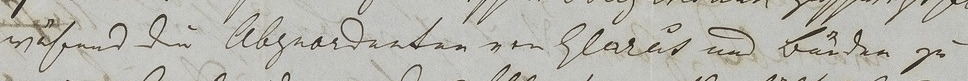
während die Abgeordneten von Glarus und Bünden zu
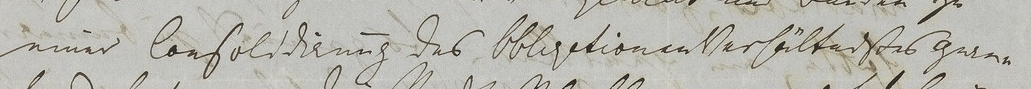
einer Consolidirung des Obligationen Verhältnißes gerne
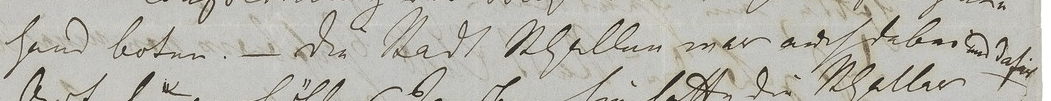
Hand boten. – Die Stadt StGallen war auch dabei und dafür.
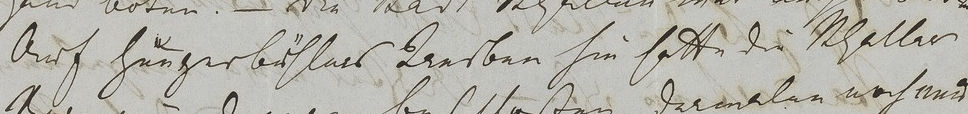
Auf Hungerbühlers Treiben hin hatte die StGaller
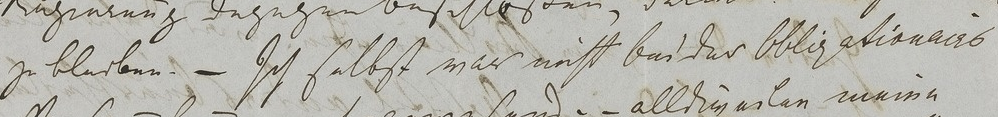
zu bleiben. – Ich selbst war nicht bei der Obligationairs
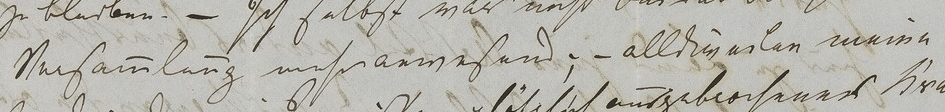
Versammlung mehr anwesend; – alldiweilen meine
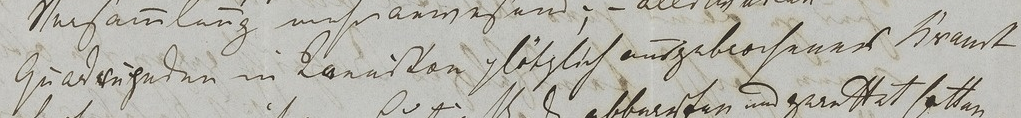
Quadrupeden in Taenikon plötzlich ausgebrochener Kranck-
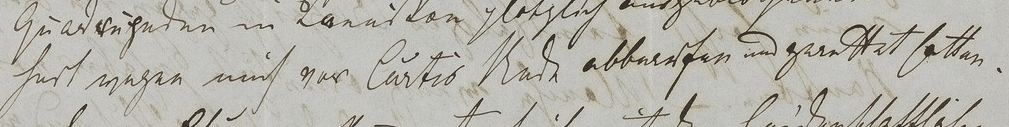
heit wegen mich vor Curtis Rede abberufen und gerettet hatten.
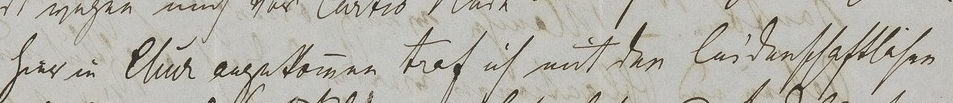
Hier in Chur angekommen traf ich mit den leidenschaftlichen
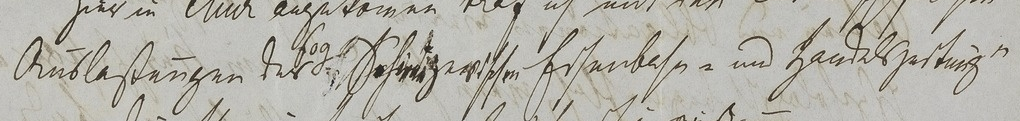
Auslaßungen der sog. «Schweizerischen Eisenbahn- und Handelszeitung»
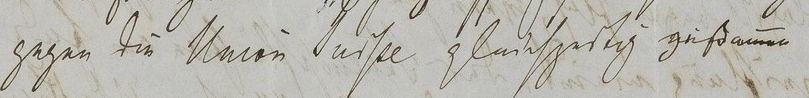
gegen die Union Suisse gleichzeitig zusammen.
